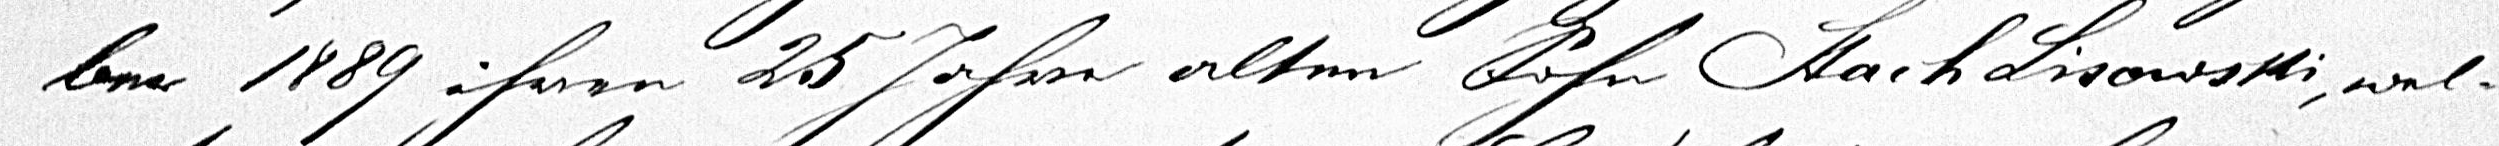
ber 1889 ihren 25 Jahre alten Sohn Stach Lisowski, wel¬
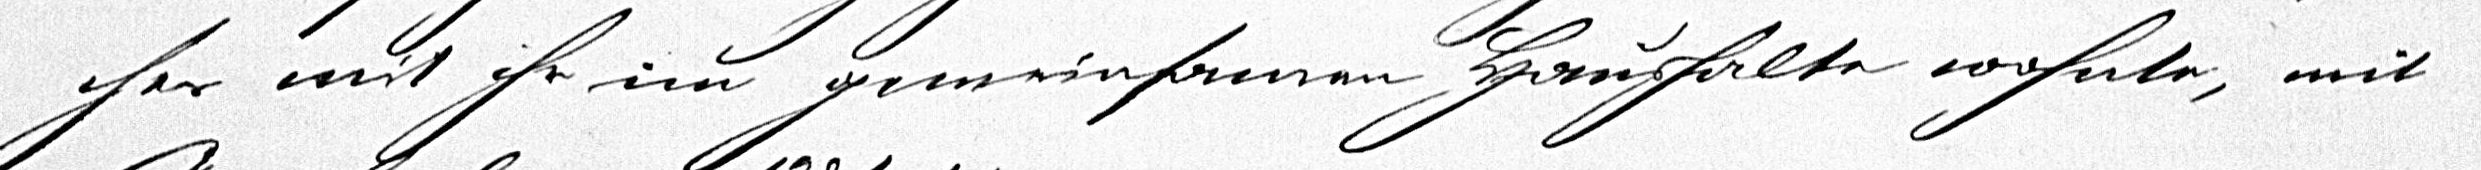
cher mit ihr im gemeinsamen Haushalte wohnte, mit
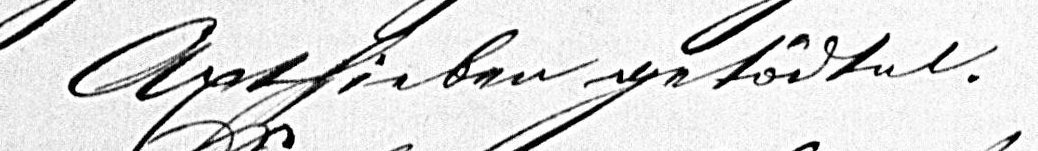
Axthieben getödtet.
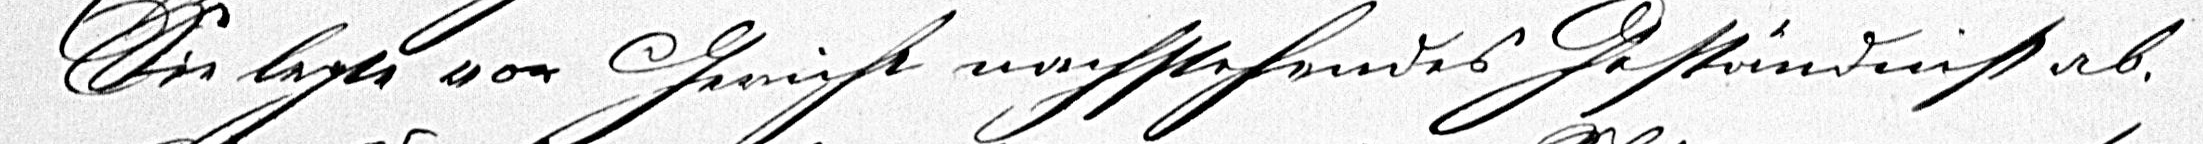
Sie legte vor Gericht nachstehendes Geständniß ab.
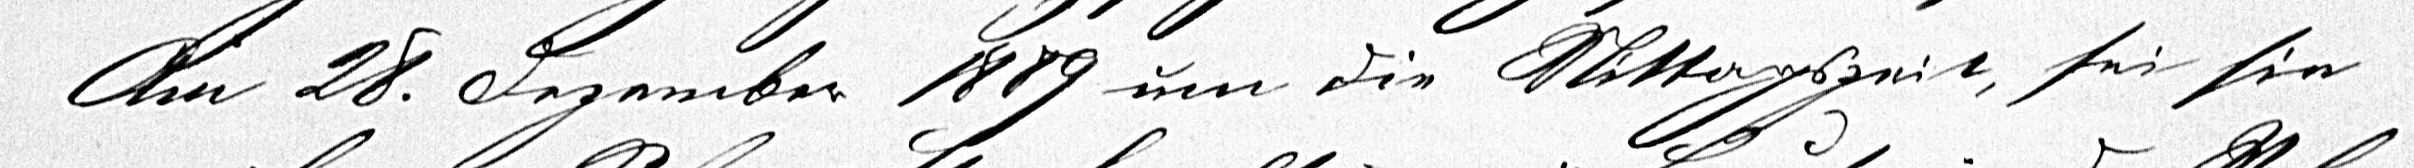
Am 28 Dezember 1889 um die Mittagszeit, sei sie
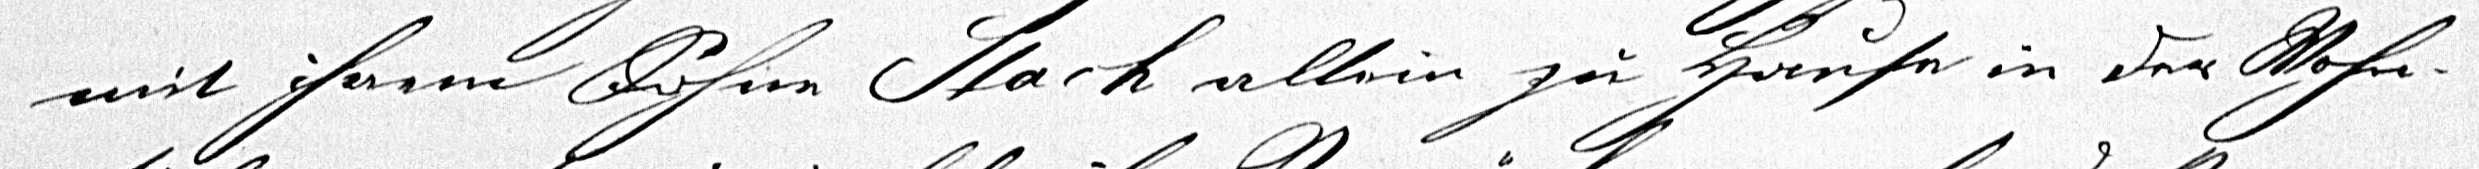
mit ihrem Sohne Stach allein zu Hause in der Wohn¬
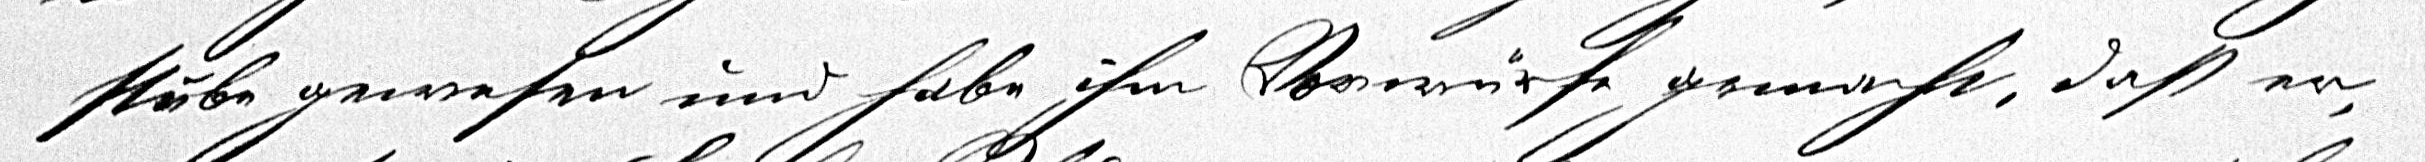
stube gewesen und habe ihm Vorwürfe gemacht, daß er,
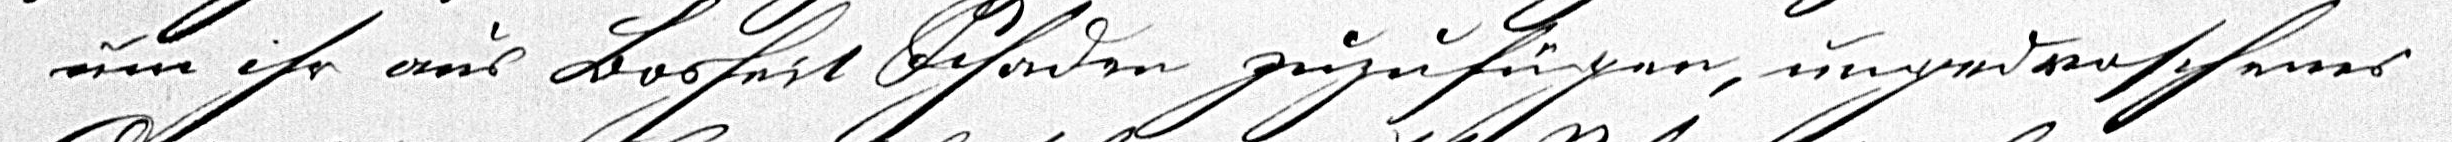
um ihr aus Bosheit Schaden zuzufügen, ungedroschenes
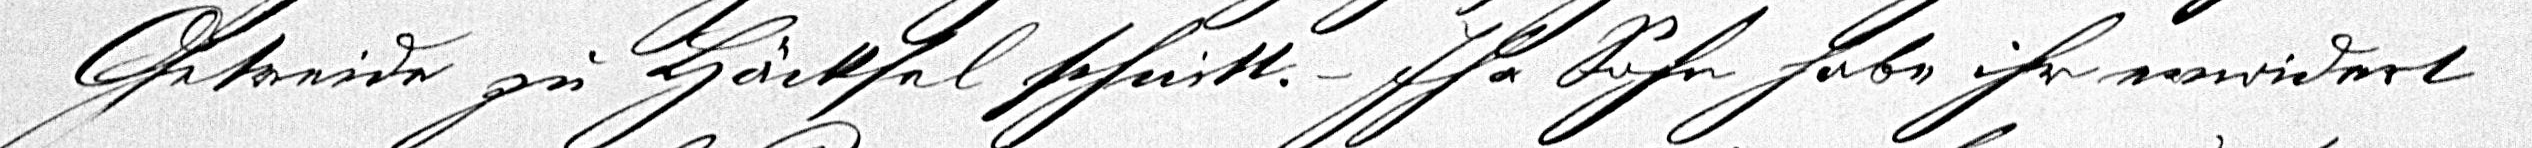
Getreide zu Häcksel schnitt. - Ihr Sohn habe ihr erwidert
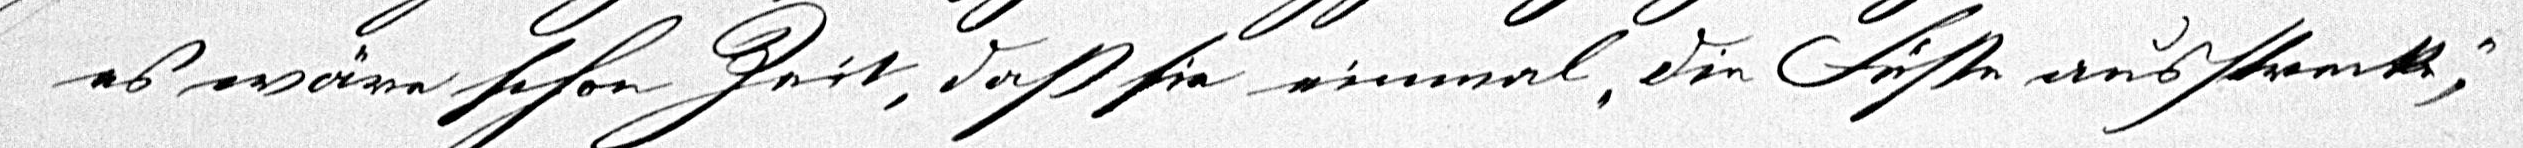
es wäre schon Zeit, daß sie einmal „die Füße ausstrecke,"
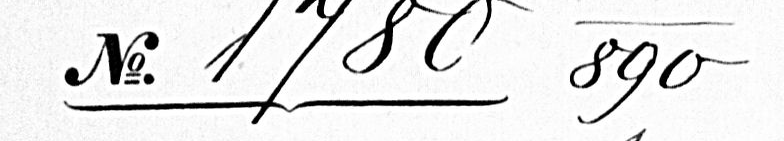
N° 1780 890
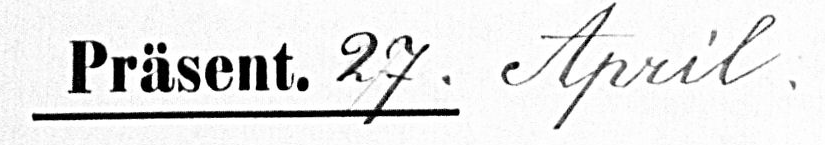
Präsent. 27. April
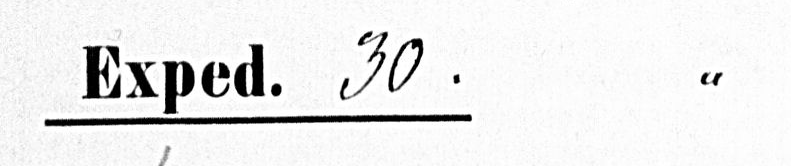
Exped. 30. April
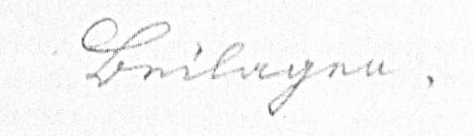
Beilagen.
